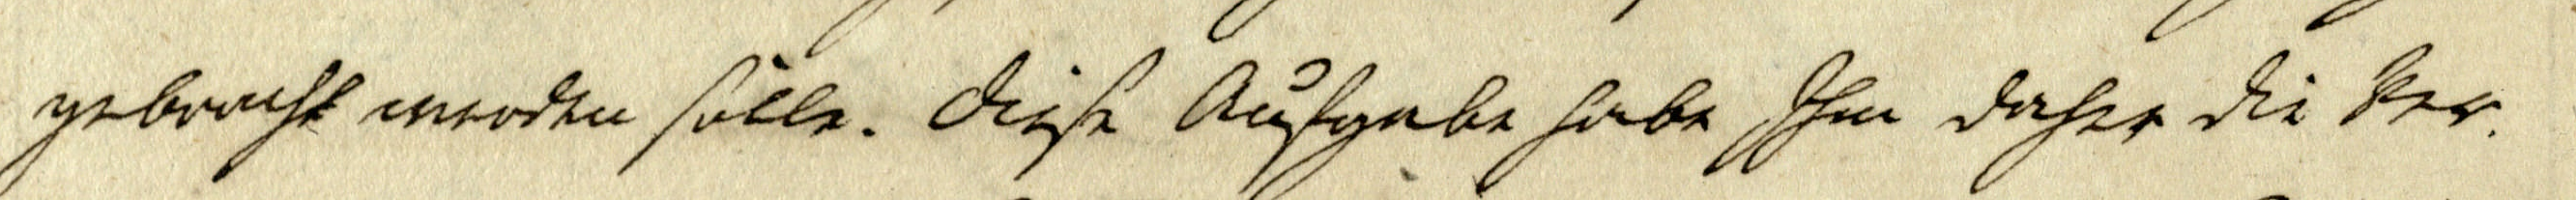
gebracht werden solle. Diese Aufgabe habe Ihm daher die Ver¬
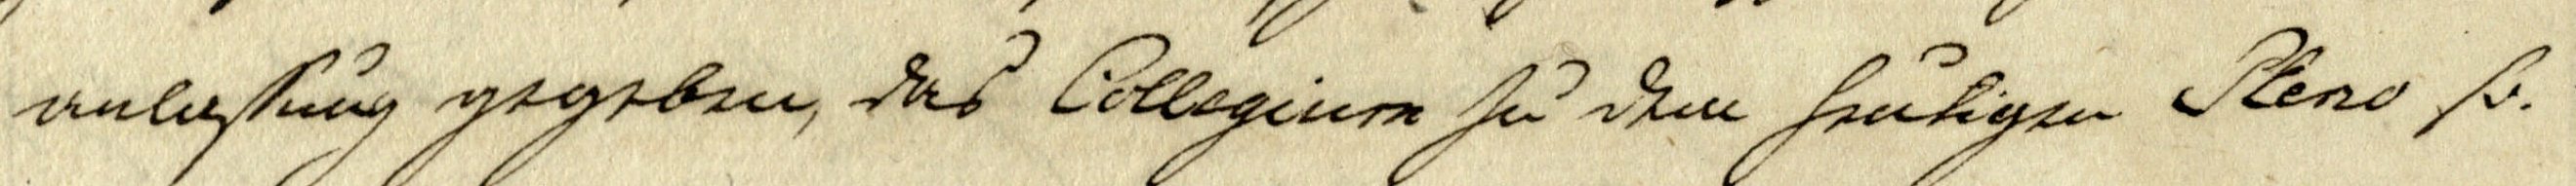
anlassung gegeben, das Collegium zu dem heutigen Pleno so¬
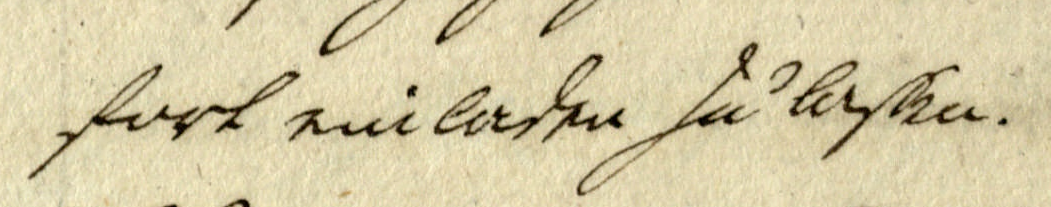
fort einladen zu lassen.
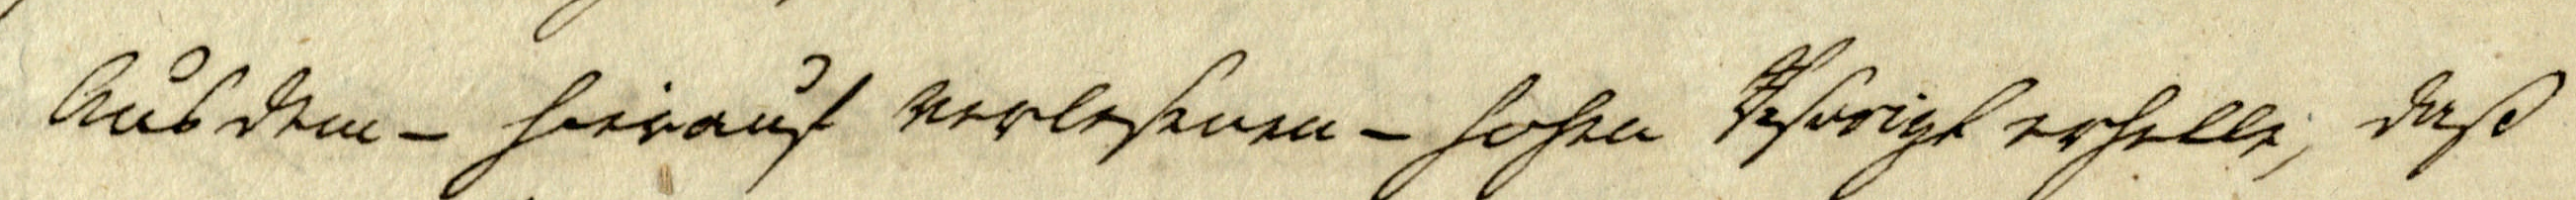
Aus dem hierauf verlesenen hohen Rescript erhelle, daß
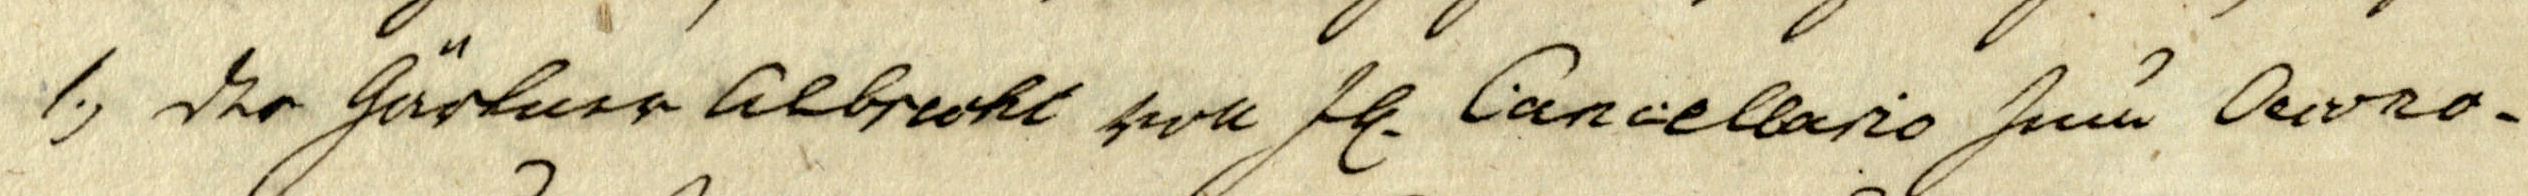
1., der Gärtner Albrecht von Ill. Cancellario zum Oecono¬
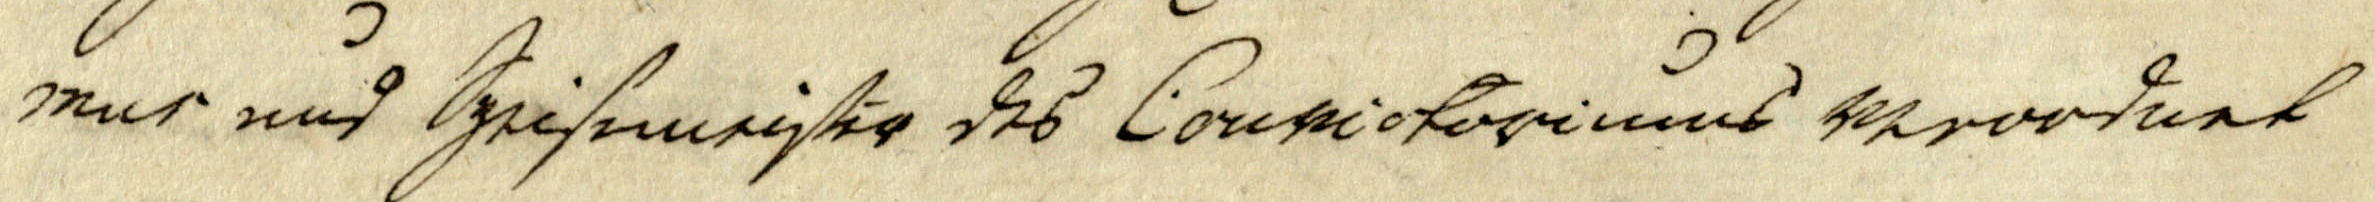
mus und Speisemeister des Convictoriums verordnet
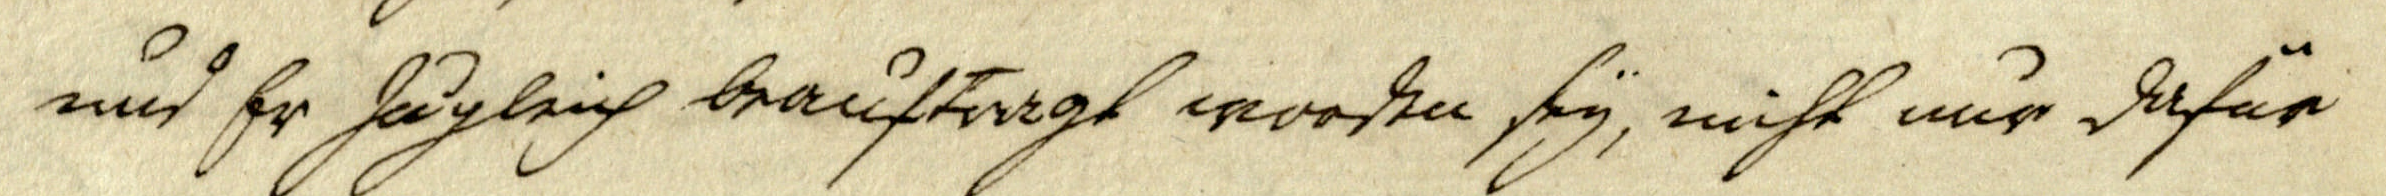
und Er zugleich beauftragt worden seÿ, nicht nur dafür
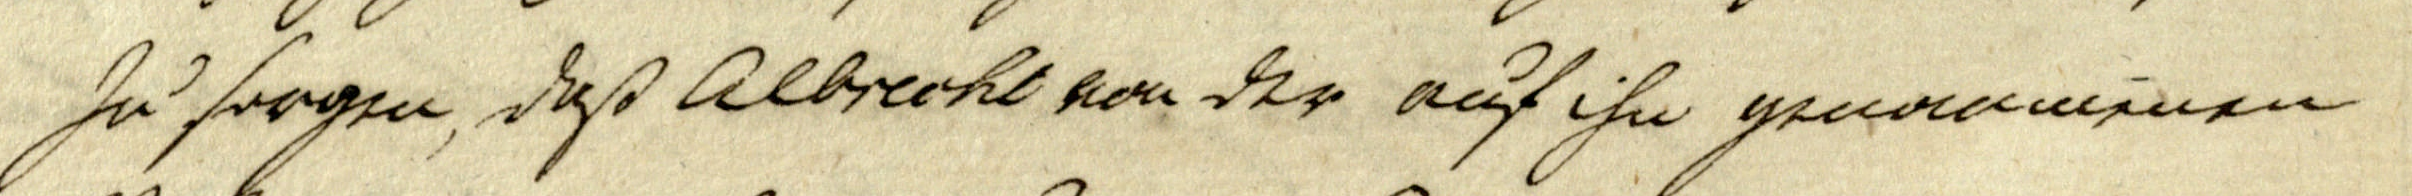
zu sorgen, daß Albrecht von der auf ihn genommenen
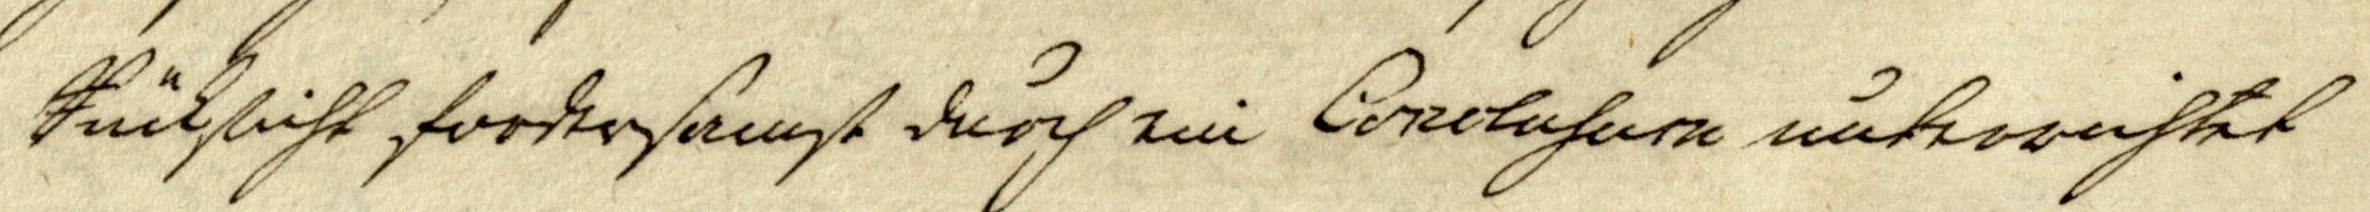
Rücksicht fordersamst durch ein Conclusum unterrichtet
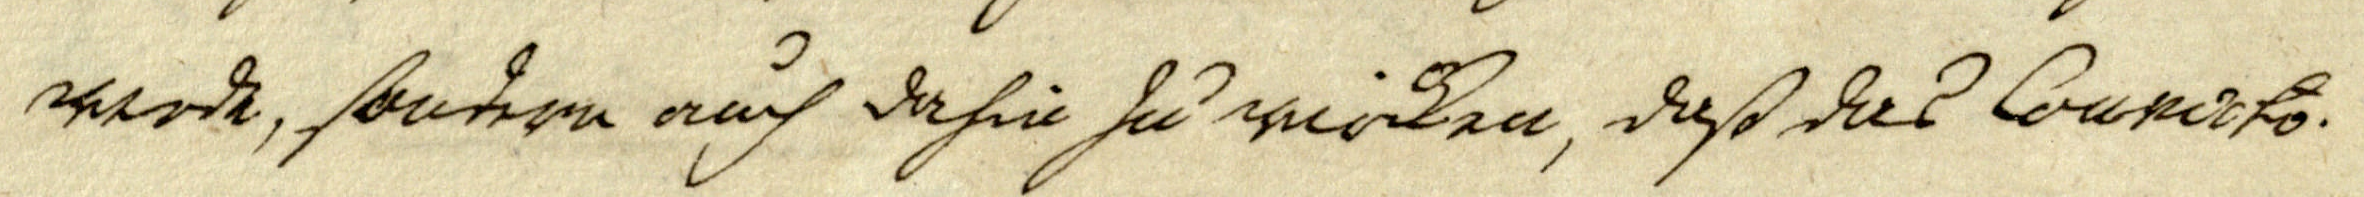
werde, sondern auch dahin zu wircken, daß das Convicto¬
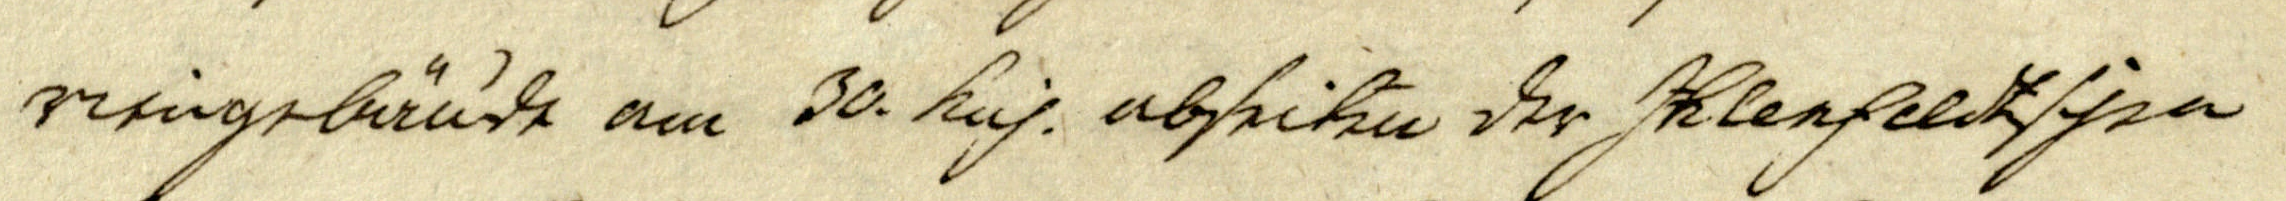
riengebäude am 30. huj. abseiten der Ihlenfeldtschen
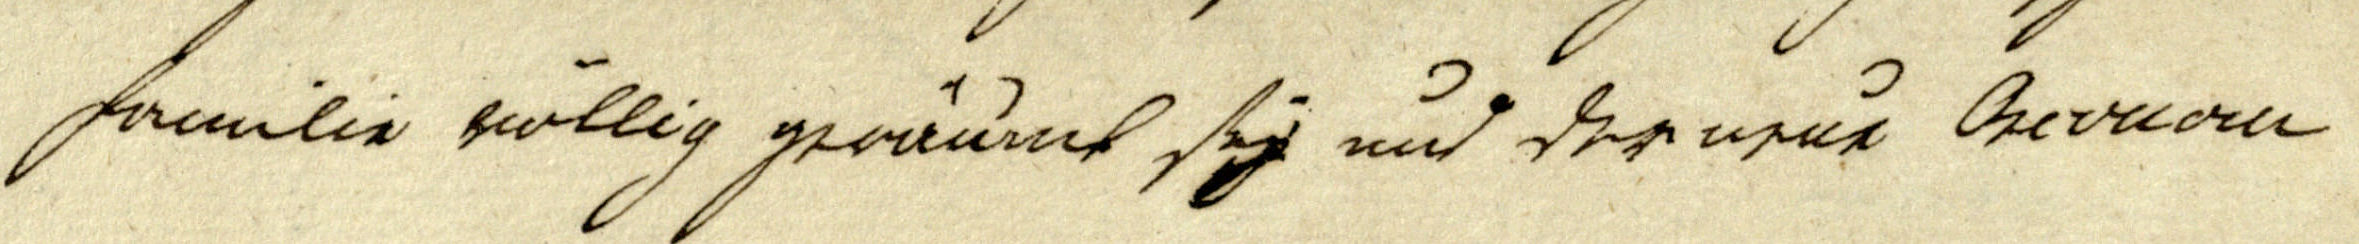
Familie völlig geräumt seÿ und der neue Oeconom
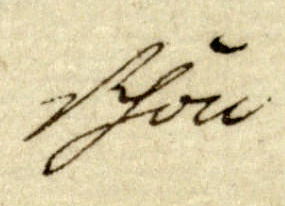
schon
